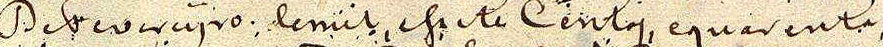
De Fevereyro; de mil, e sseteCentos, e quarenta
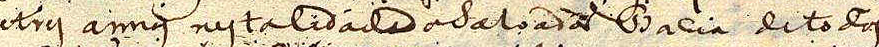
e tres annos nesta Cidade o Salvador Bahia di todos
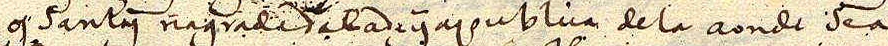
os Santos na grade da Cadeya publica dela aonde se a
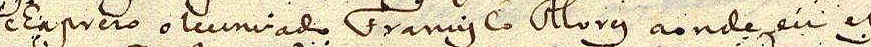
cha prezo o lecenciado FrancisCo Alvres aonde eu es
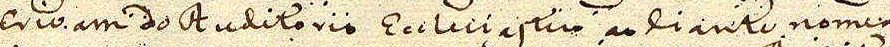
crivam do Auditorio Ecclesiastico ao diante nomea
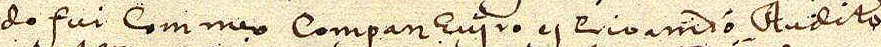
do fui Com meo Companheyro escrivam do Audito
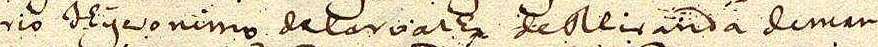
rio Hyeronimo de Carvalho de Miranda deman
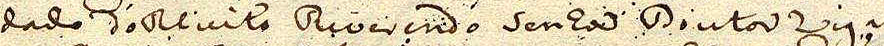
dado do Muito Reverendo Senhor Doutor Viga
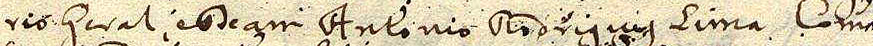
rio Geral, e Deam Antonio Rodrigues Lima Comi
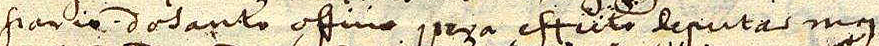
ssario do Santo officio pera effeito de putas mas
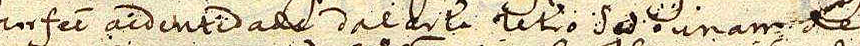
por feé a identidade da carta Retro sēdo a mam de
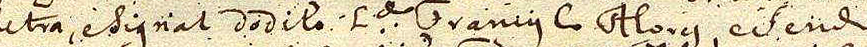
letra, e Signal do dito L.do FrancisCo Alvres, e sendo
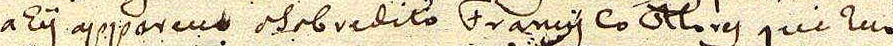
ahy appareceo o sobredito FrancisCo Alvres que Reco
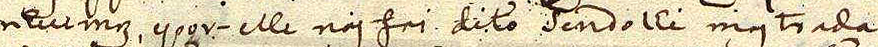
nhecemoz, e por elle nos foi dito sendo lhe mostrado
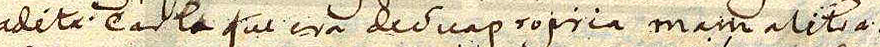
a dita carta que era de sua propria mam a letra:
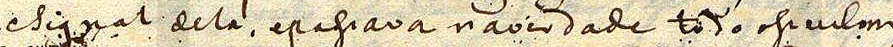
e signal dela, e passava na verdade todo o seu Com
